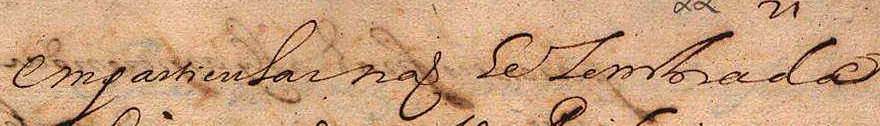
em particular naõ he lembrada
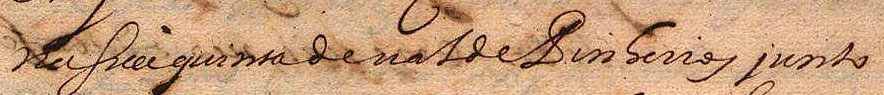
na sua quinta de ual de Pinheiros junto
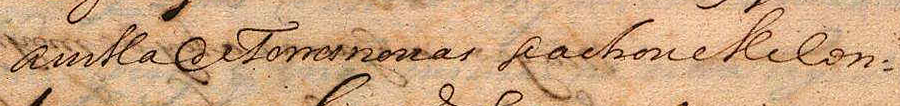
a uilla de Torres nouas se achou elle con
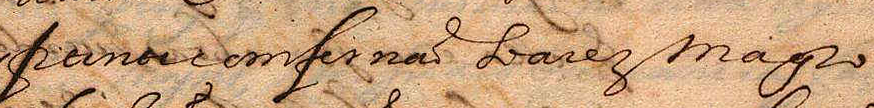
fitente com fernaõ soarez magro
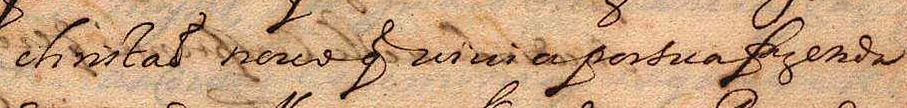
christaõ nouo q̄ uiuia por sua fazenda
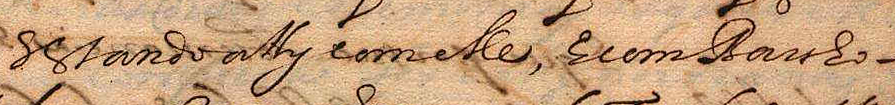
Estando ally com elle, E com Bartho
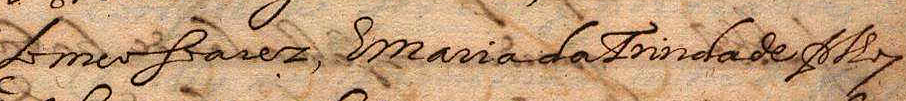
lomeo Soarez, E maria da Trindade filhos
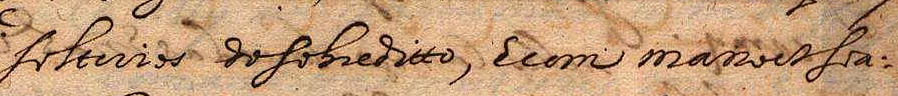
solteiros do sobreditto, E com manoel soa
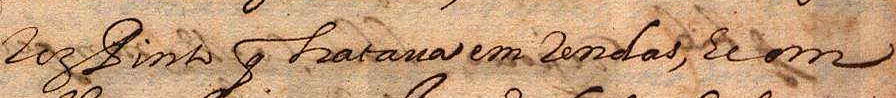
rez Pinto q̄ trataua em rendas, E com
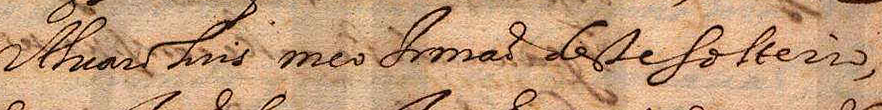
Aluaro Luis meo Jrmaõ deste solteiro,
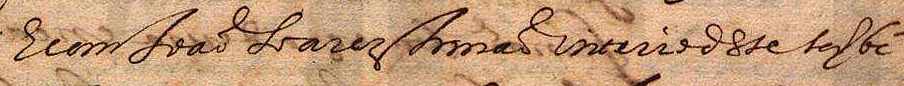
E com Joaõ Soarez Irmaõ inteiro deste taõbē
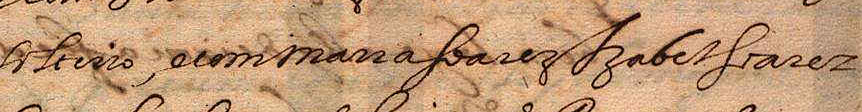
solteiro, e com maria soarez Izabel Soarez
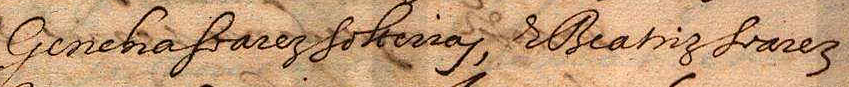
Genebra Soarez solteiras, E Beatriz Soarez
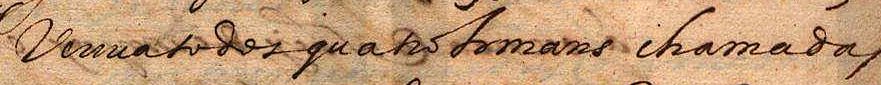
Viuua todos quatro Irmans chamadas
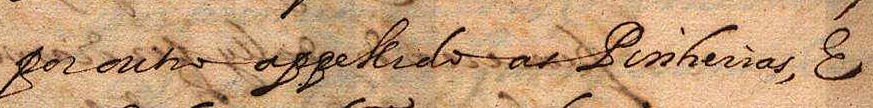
por outro appellido as Pinheiras, E
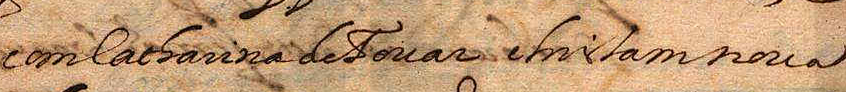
com Catharina de Touar christam noua
